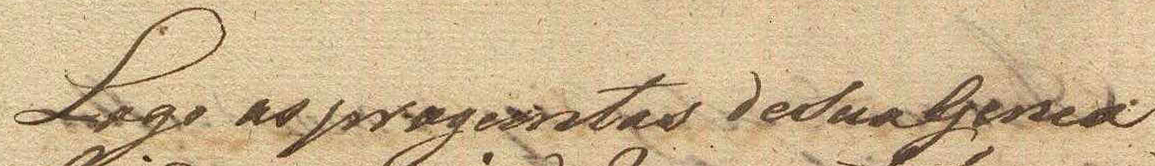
Logo as proguntas de sua genea
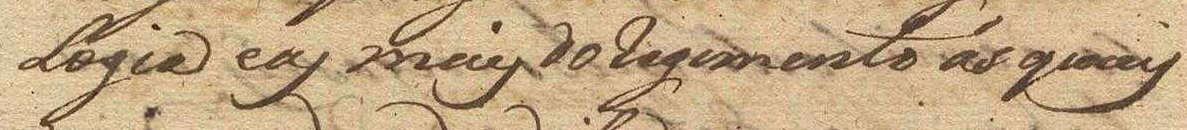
Logia e as mais do Regimento às quais
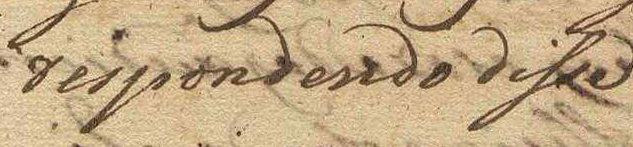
respondendo disse
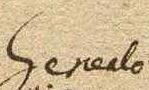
Genealo
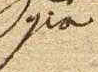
gia
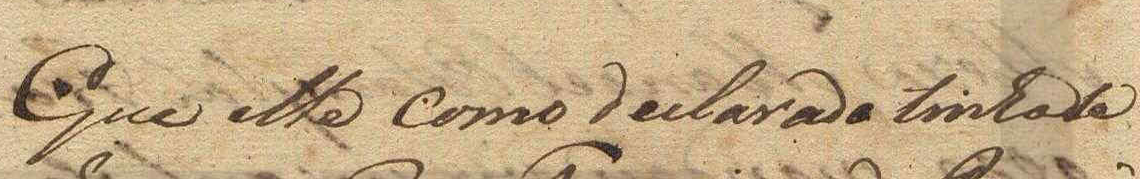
Que elle como declarado tinha se
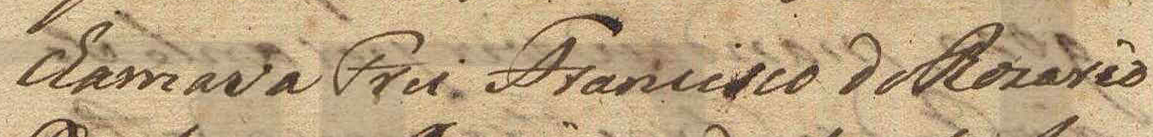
chamava Frei Francisco do Rozario
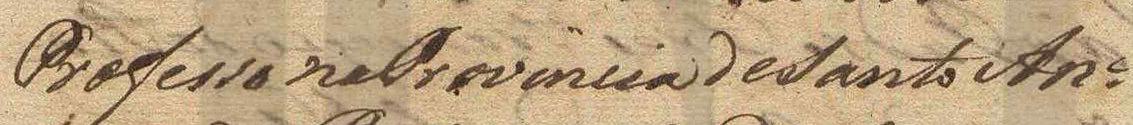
Professo na Provencia de Santo An
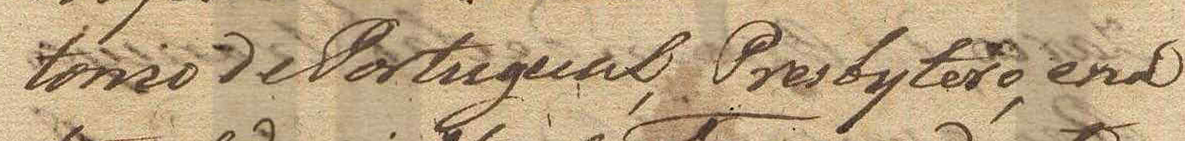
tonio de Portugual, Presbytero, e na
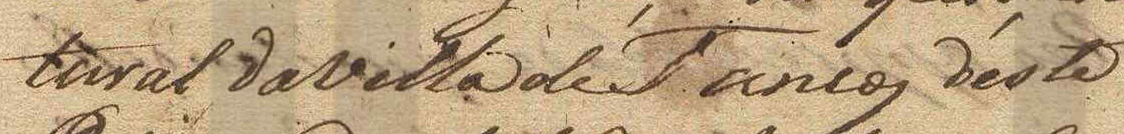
tural da villa de Tancos deste
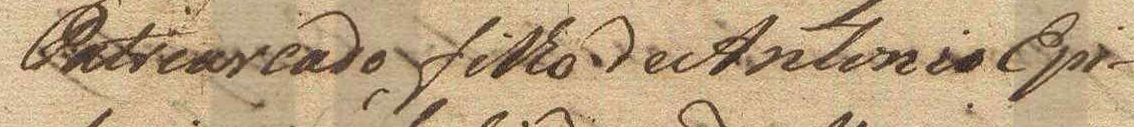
Patriarcado filho de Antonio Epi
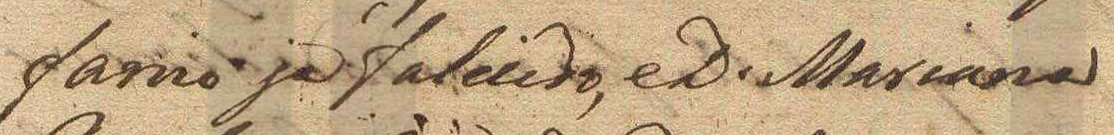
fanio já falecido, e D. Mariana
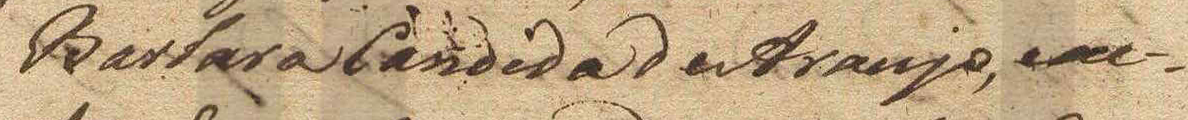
Barbara Candida de Araujo, e ac
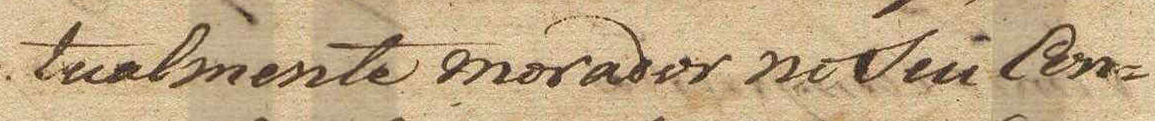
tualmente morador no Seu Con
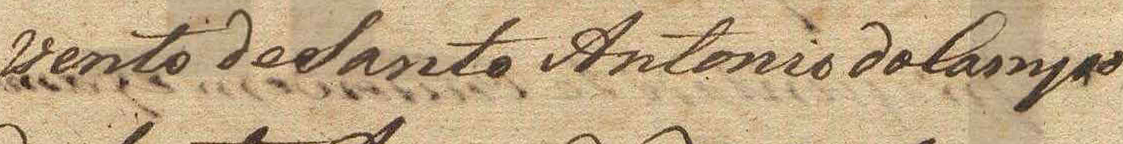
vento de Santo Antonio do Campo
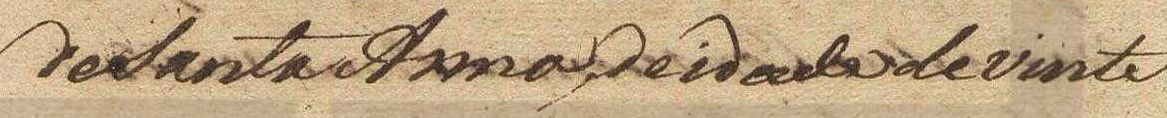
de Santa Anna, de idade de vinte
